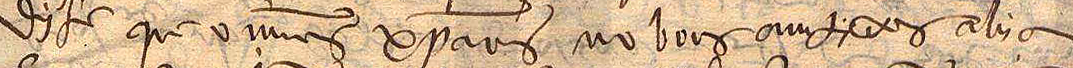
dyse que om̄es xpãos novoos amtigos avia
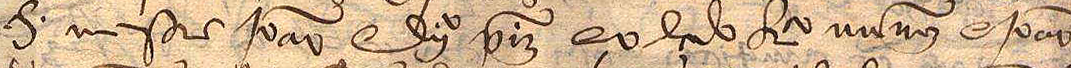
.S. mestre João e dyo p̄iz e o lçdo frco nun̄ez e João
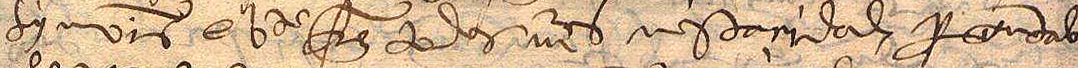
symõis e vte f̄rz todos mres nesta çidade ꝑgūtado
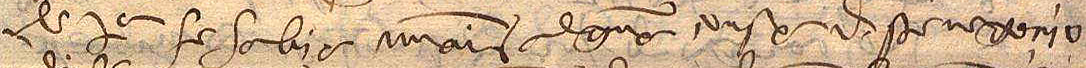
ele ta Se Sabia māis algūa cousa deste negoçio
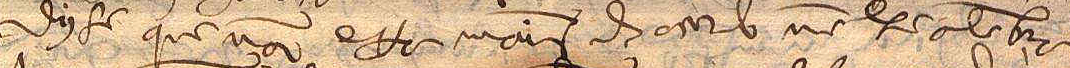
dyse que não eRa māis de acordo nē lhe alēbra
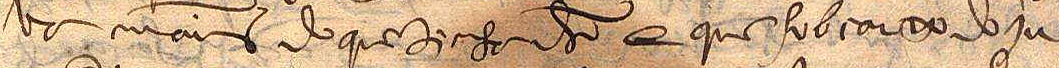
va māis do que tinha d̄to e que Sob cargo do ju
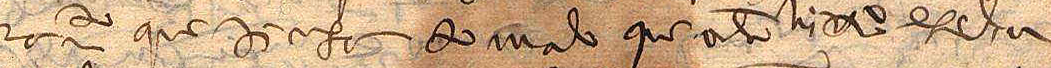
ramto que tinha tomado que o d̄to vigro lhe deu
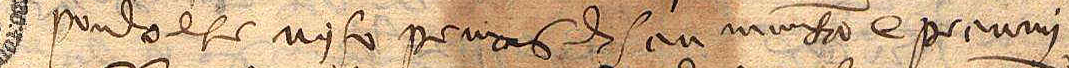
pondo lhe nyso penas descumunhão e pecuny
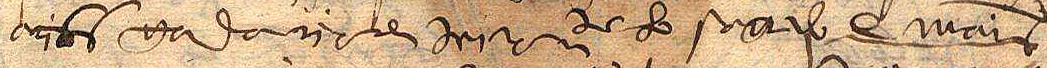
arias gardaria ēteiramte ho segredo e māis
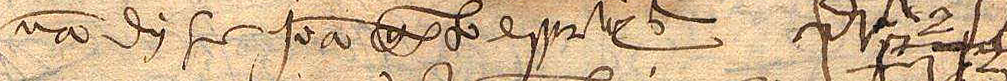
não dyse João ḡs ho esprevy
